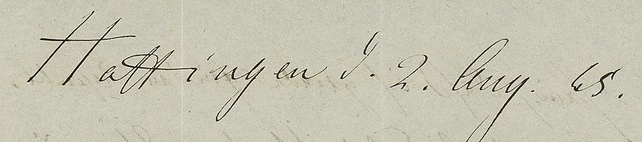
Hottingen d. 2. Aug. 45.
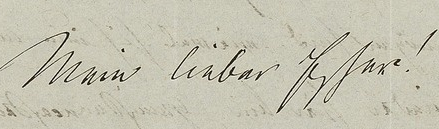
Mein lieber Escher!
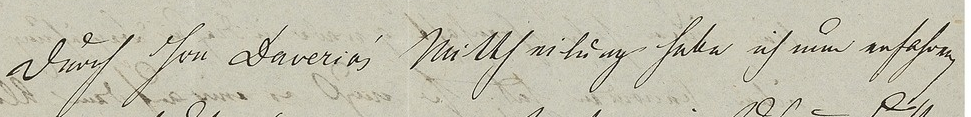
Durch Hrn Daverio's Mittheilung habe ich nun erfahren,
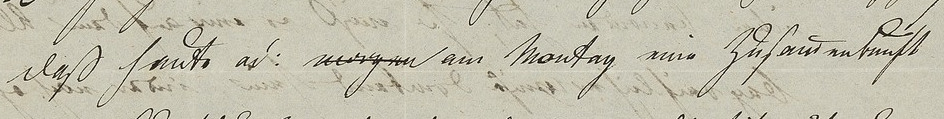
daß heute od: morgen am Montag eine Zusammenkunft
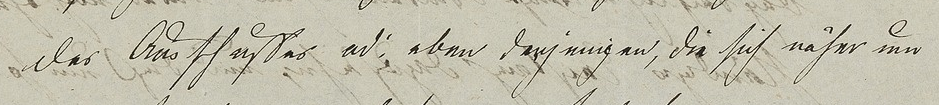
des Ausschusses od: eben derjenigen, die sich näher um
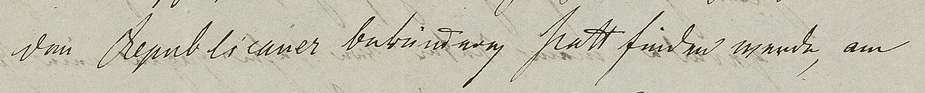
den Republicaner bekümmern, statt finden werde, am
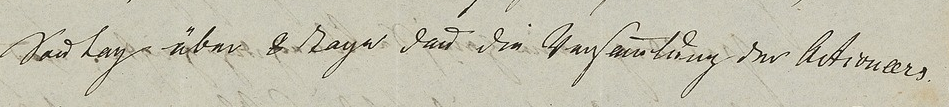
Sonntage über 8 Tage dann die Versammlung der Actioneers.
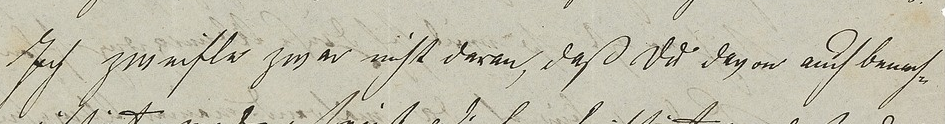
Ich zweifle zwar nicht daran, daß du davon auch benach-
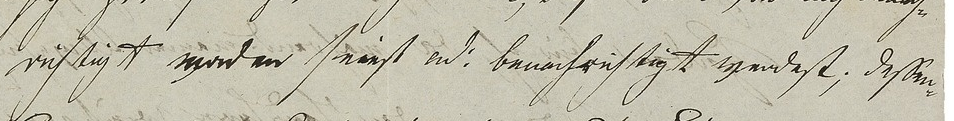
richtigt worden seiest od: benachrichtigt werdest; dessen-
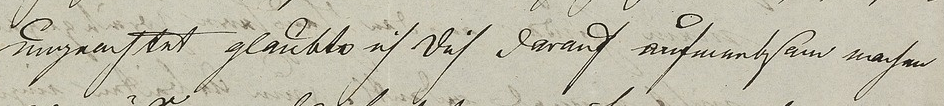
ungeachtet glaubte ich dich darauf aufmerksam machen
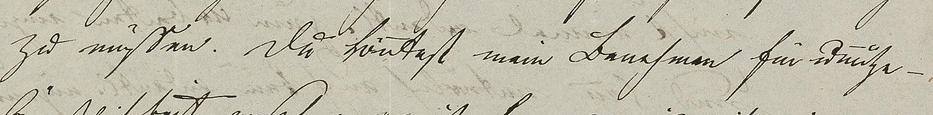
zu müssen. Du könntest mein Benehmen für unnütze
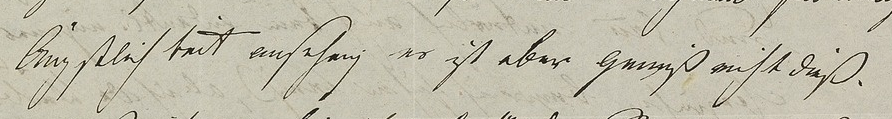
Ängstlichkeit ansehen; es ist aber gewiß nicht dieß.
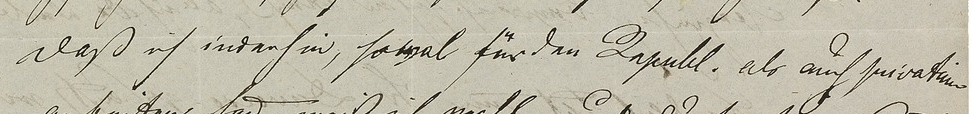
Daß ich immerhin, sowol für den Republ. als auch privatim
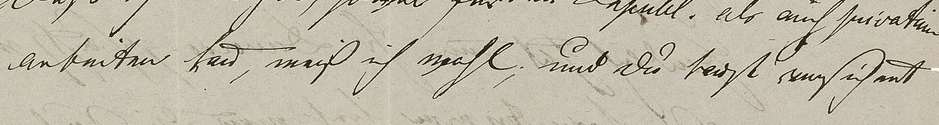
arbeiten kann, weiß ich wohl; und du kannst versichert
